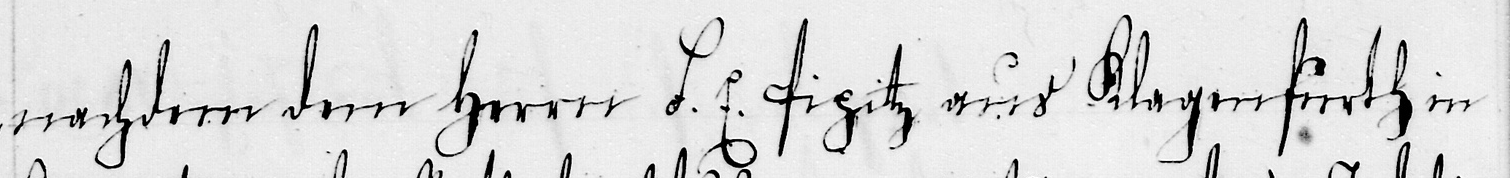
nachdem dem Herrn L. E. Pipitz aus Klagenfurth in
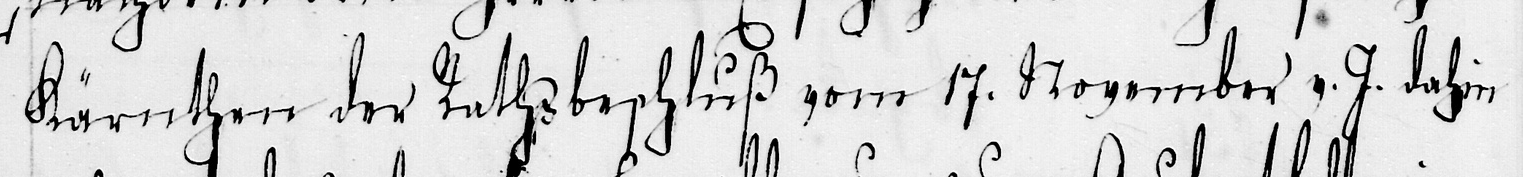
Kärnthen der Rathsbeschluß vom 17. November v. J. dahin
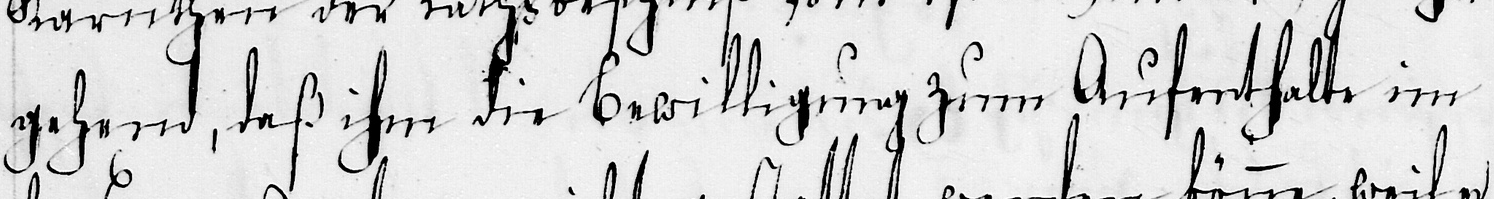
gehend, daß ihm die Bewilligung zum Aufenthalte im
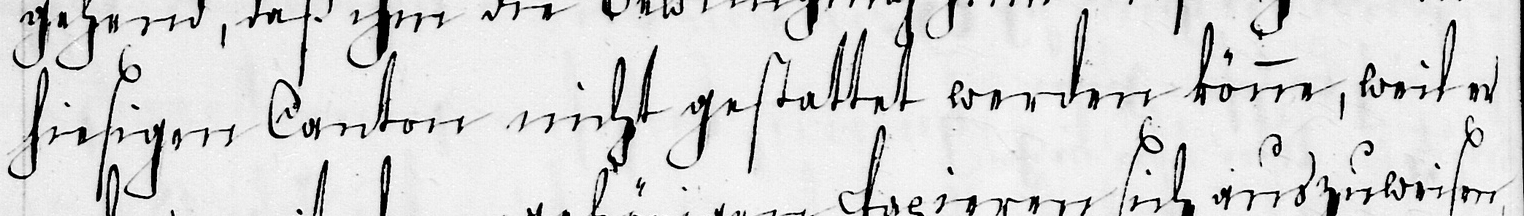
hiesigen Canton nicht gestattet werden könne, weil er
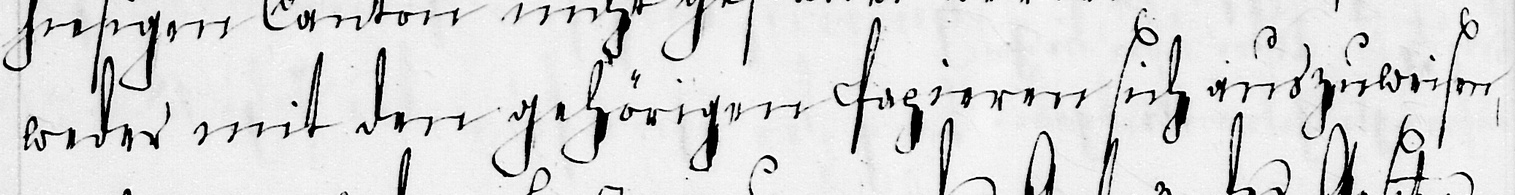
weder mit den gehörigen Papieren sich auszuweisen,
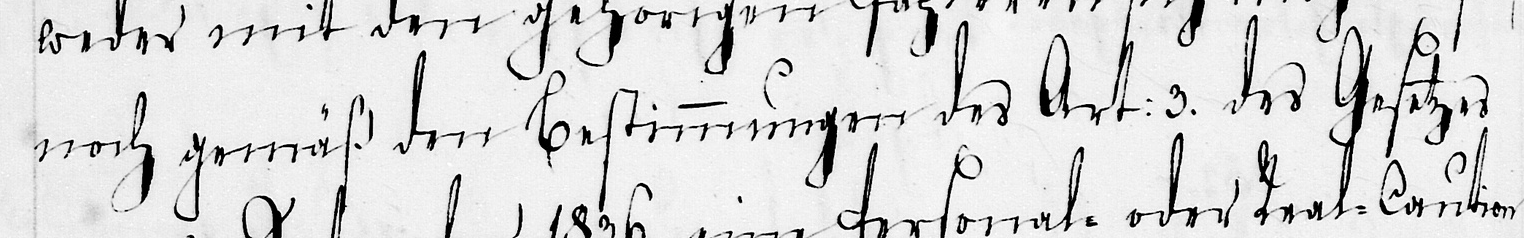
noch gemäß den Bestimmungen des Art: 3. des Gesetzes
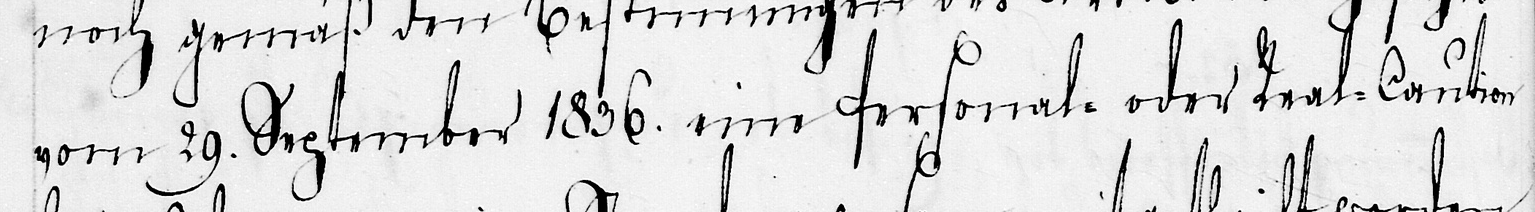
vom 29. September 1836. eine Personal- oder Real-Caution
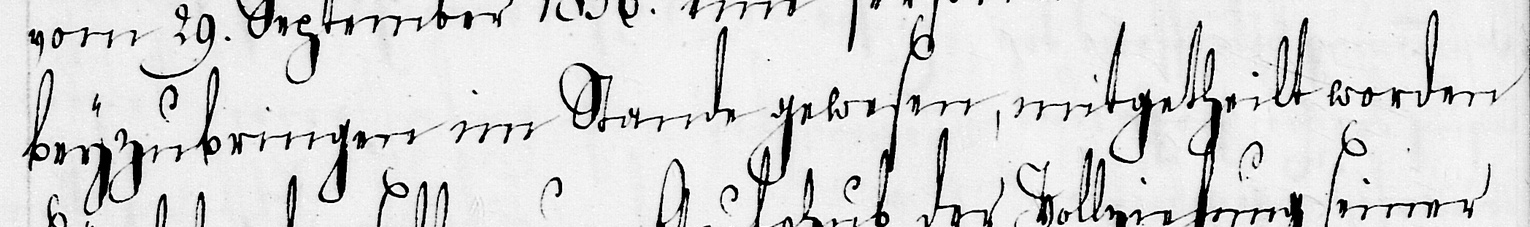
beyzubringen im Stande gewesen, mitgetheilt worden
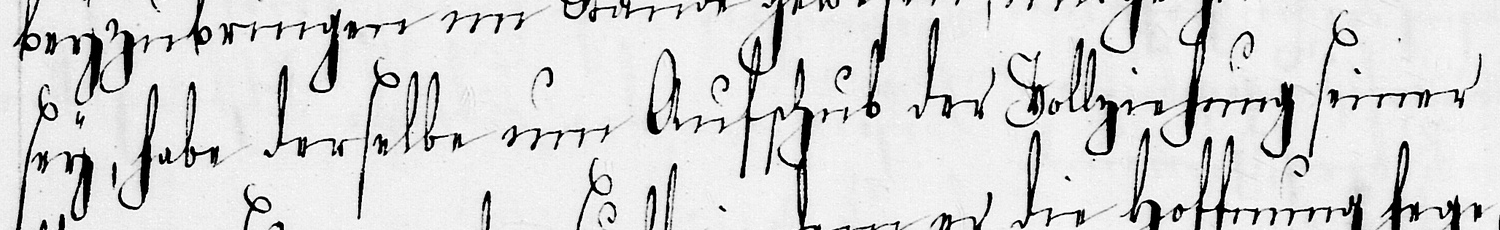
sey, habe derselbe um Aufschub der Vollziehung seiner
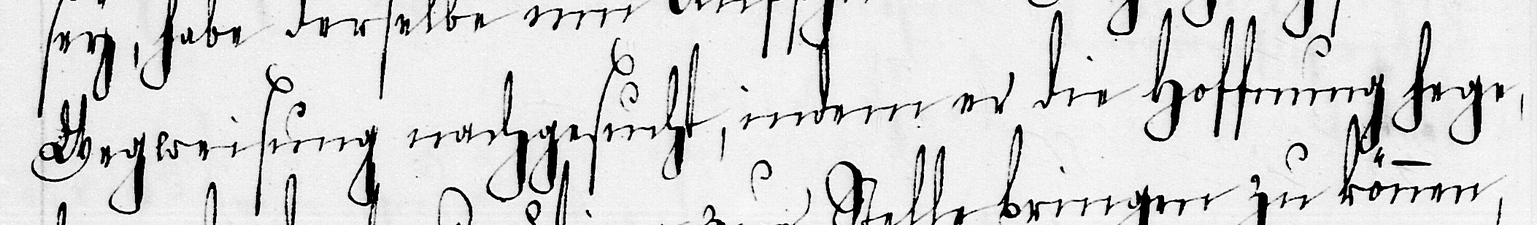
Wegweisung nachgesucht, indem er die Hoffnung hege,
